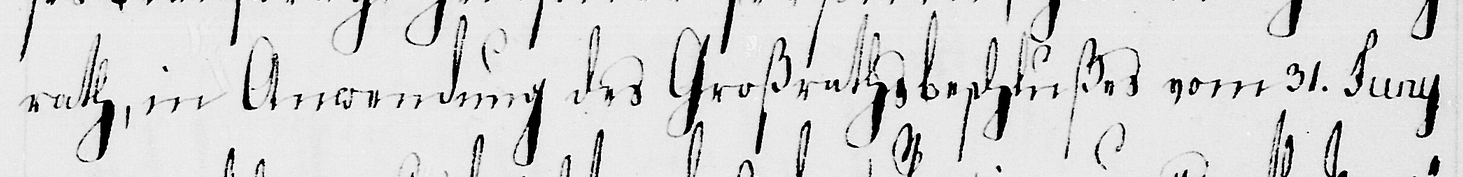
rath, in Anwendung des Großrathsbeschlußes vom 31. Juny
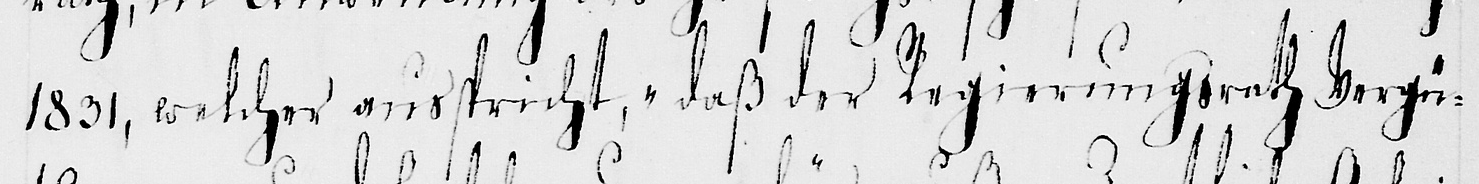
1831, welcher ausspricht, „daß der Regierungsrath Vergü¬
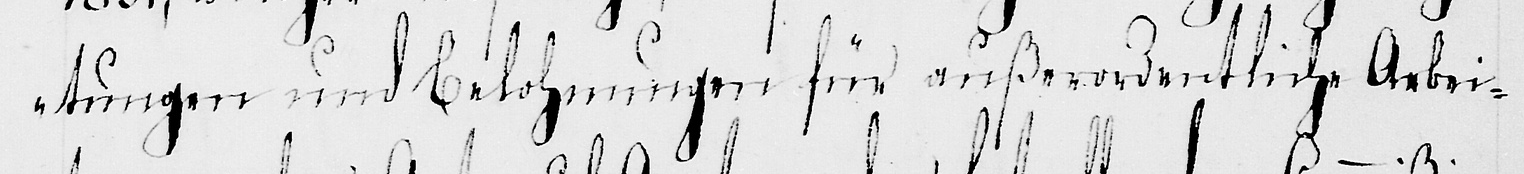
tungen und Besoldungen für außerordentliche Arbei¬
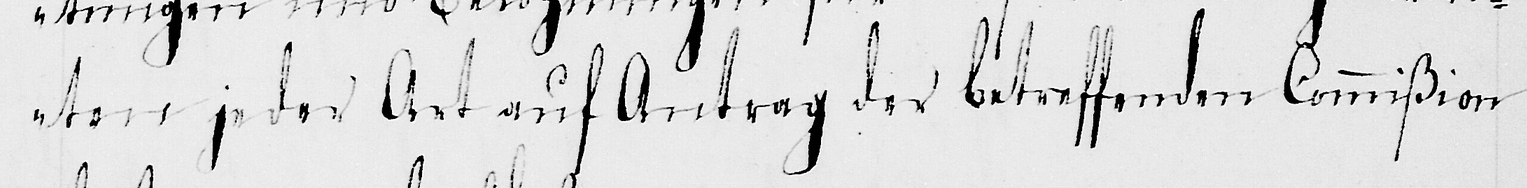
ten jeder Art auf Antrag der betreffenden Commißion
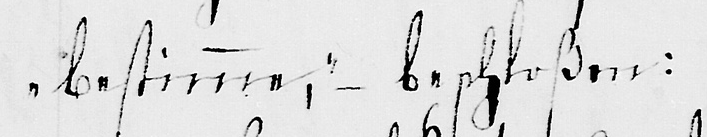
bestimme“, – beschloßen:
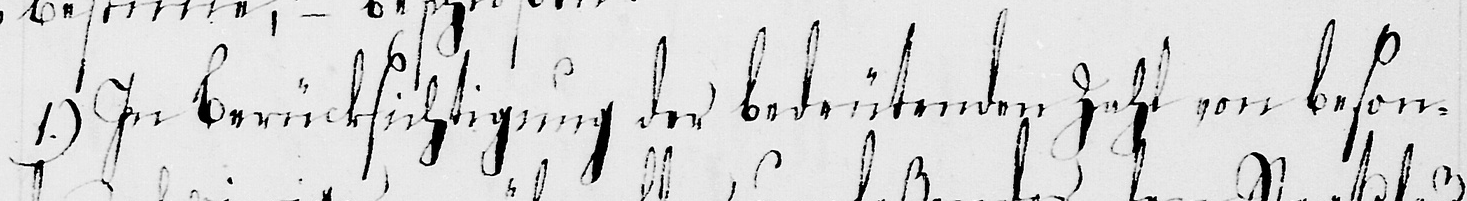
1.) In Berücksichtigung der bedeutenden Zahl von beson¬
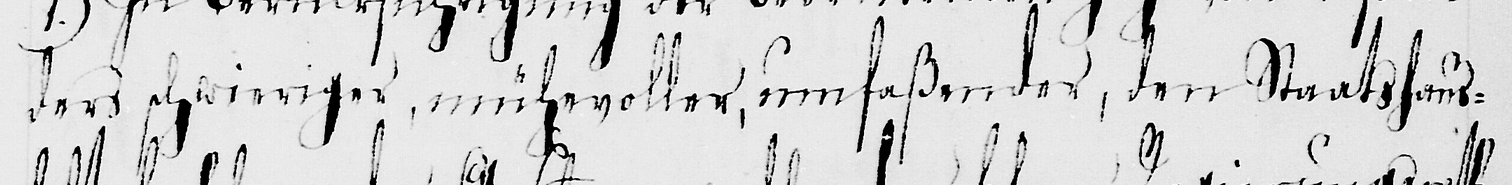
ders schwieriger, mühevoller, umfaßender, den Staatshaus¬
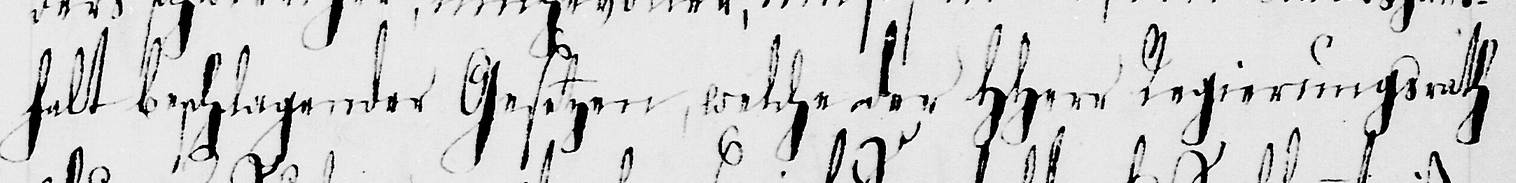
halt beschlagender Gesetzen, welche der HHerr Regierungsrath
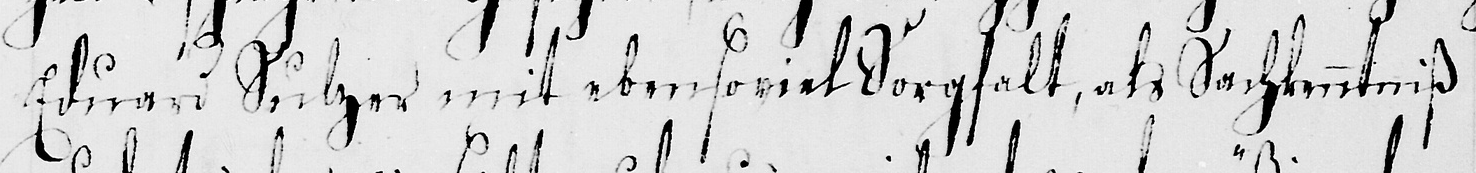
Eduard Sulzer mit ebensoviel Sorgfalt, als Sachkenntniß
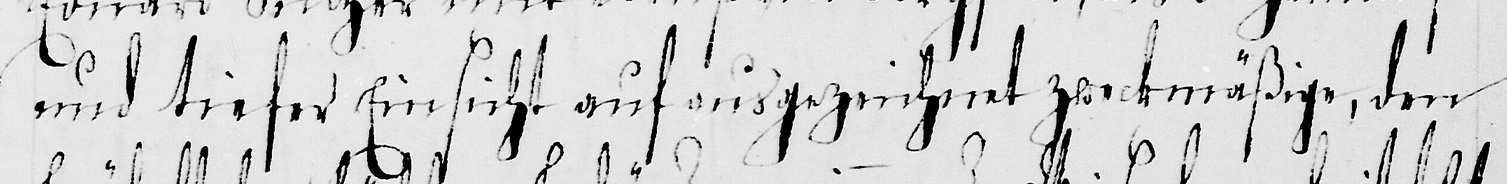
und tiefer Einsicht auf ausgezeichnet zweckmäßige, den
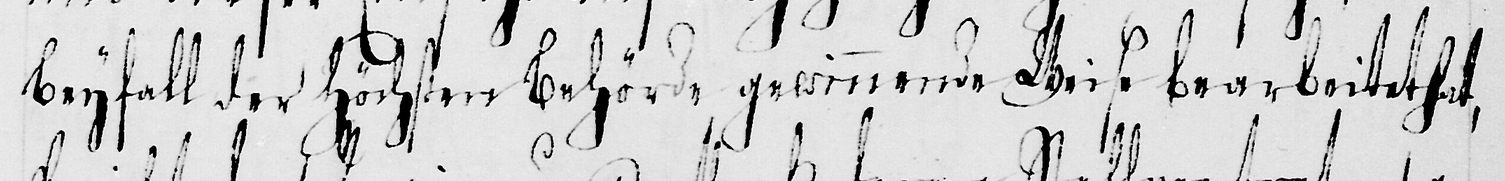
Beyfall der Höchsten Behörde gewinnende Weise bearbeitet hat,
